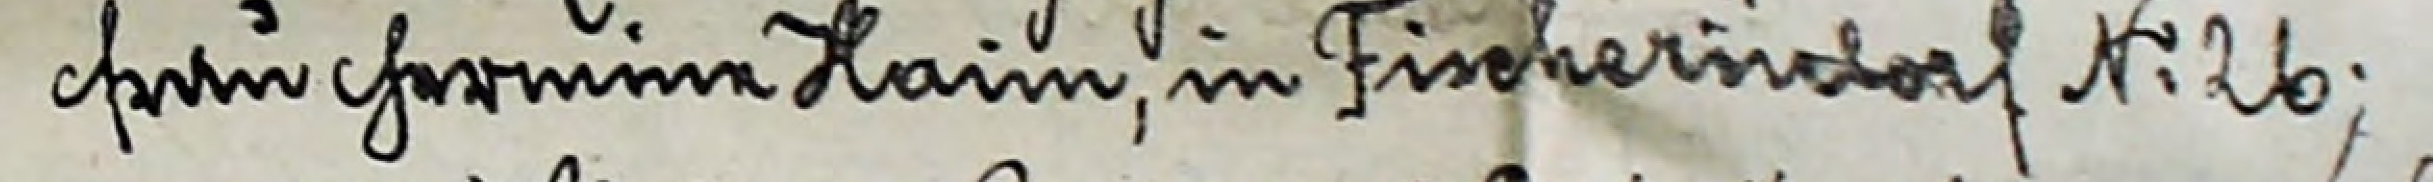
Frau Hermine Haim, in Fischerndorf № 26;
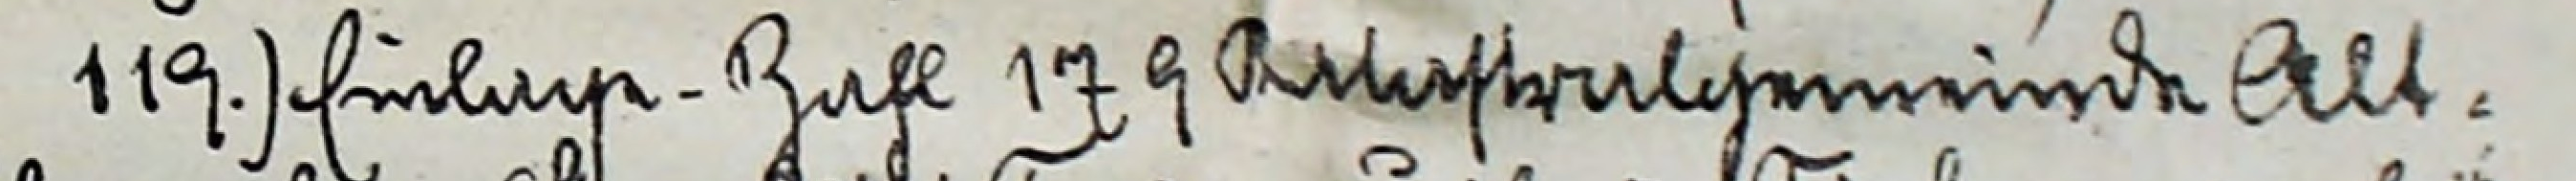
119.) Einlage - Zahl 179 Katastralgemeinde Alt=
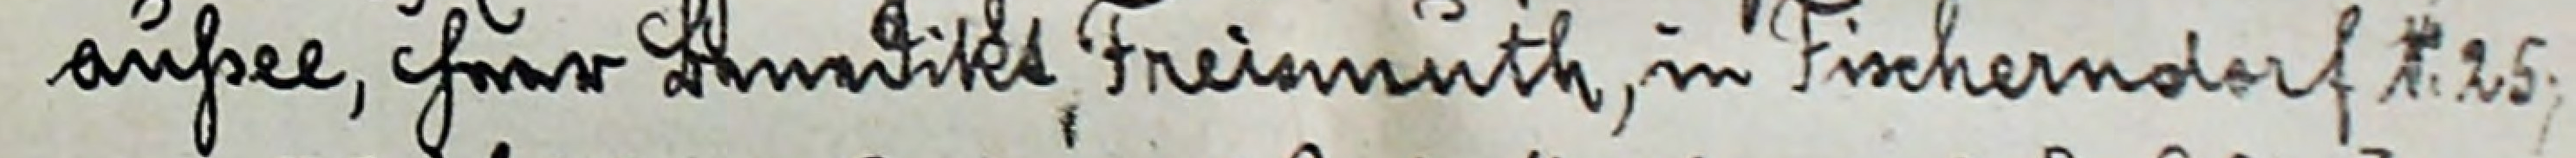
aussee, Herr Benedikt Freismuth, in Fischerndorf № 25;
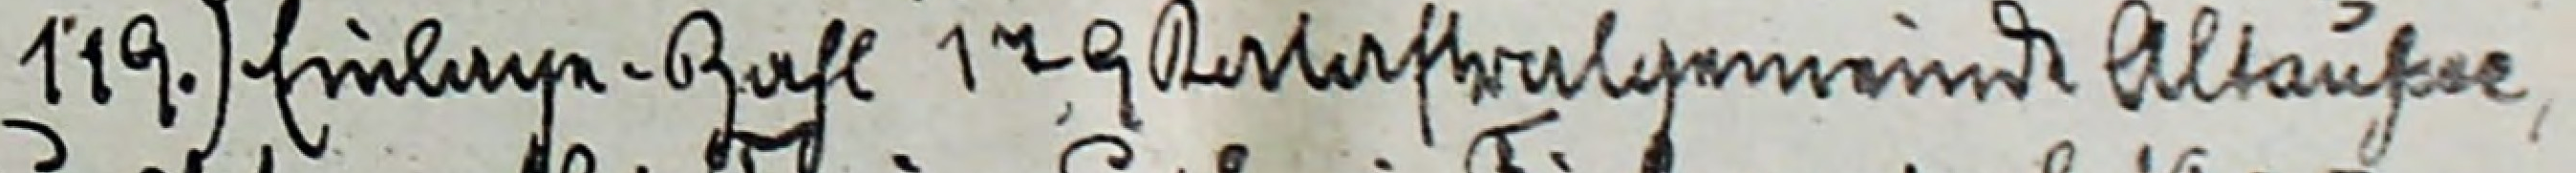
119.) Einlage - Zahl 179 Katastralgemeinde Altaussee,
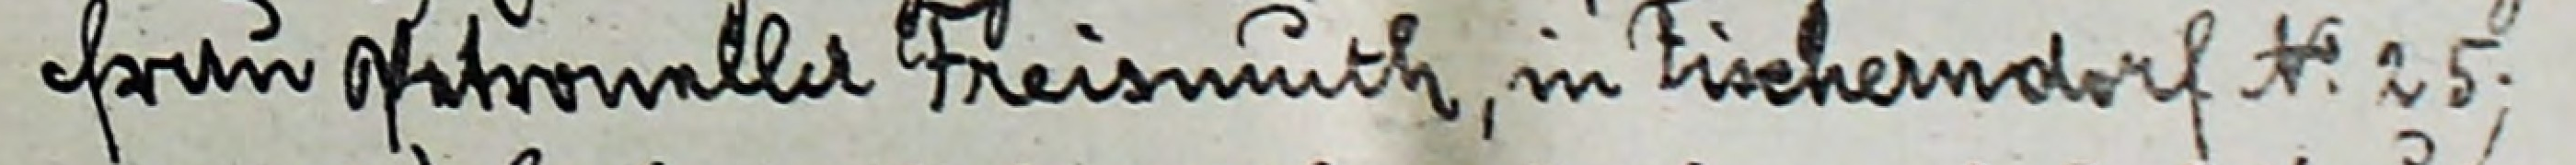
Frau Petronella Freismuth, in Fischerndorf № 25;
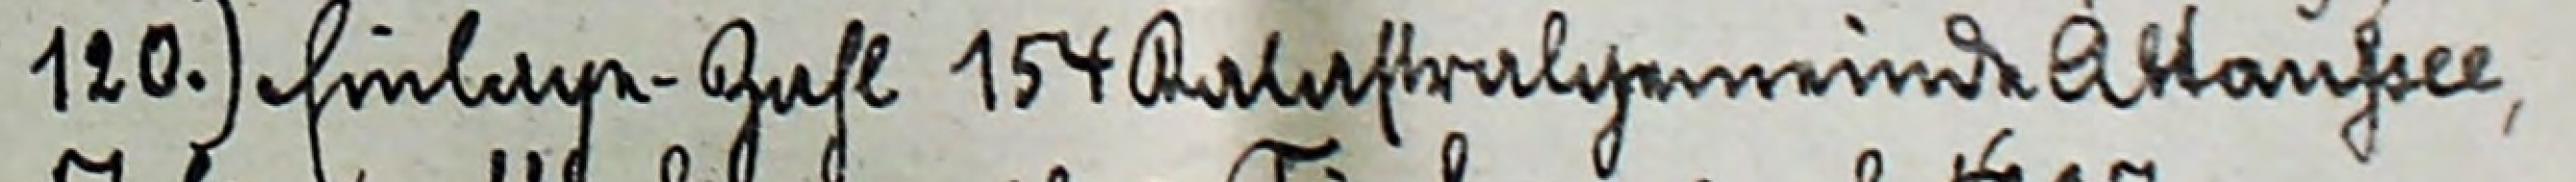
120.) Einlage - Zahl 154 Katastralgemeinde Altaussee,
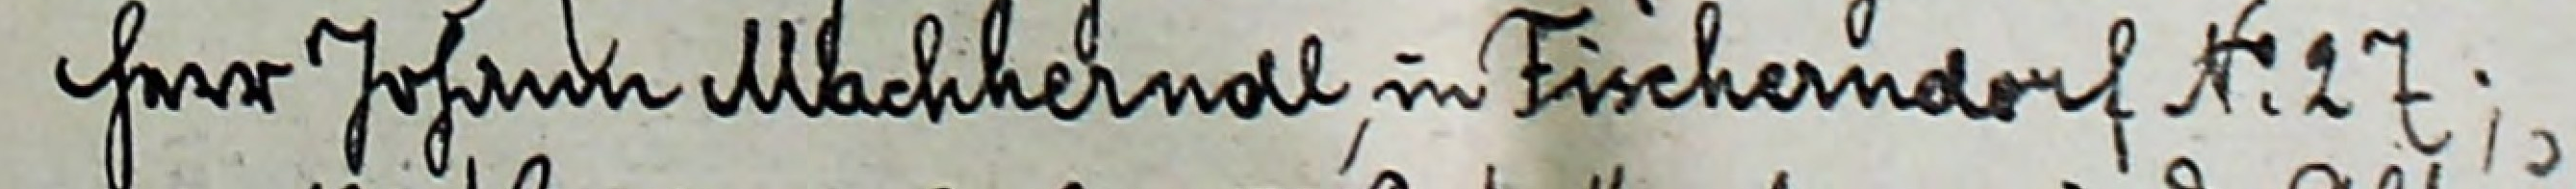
Herr Johann Machherndl, in Fischerndorf № 27;
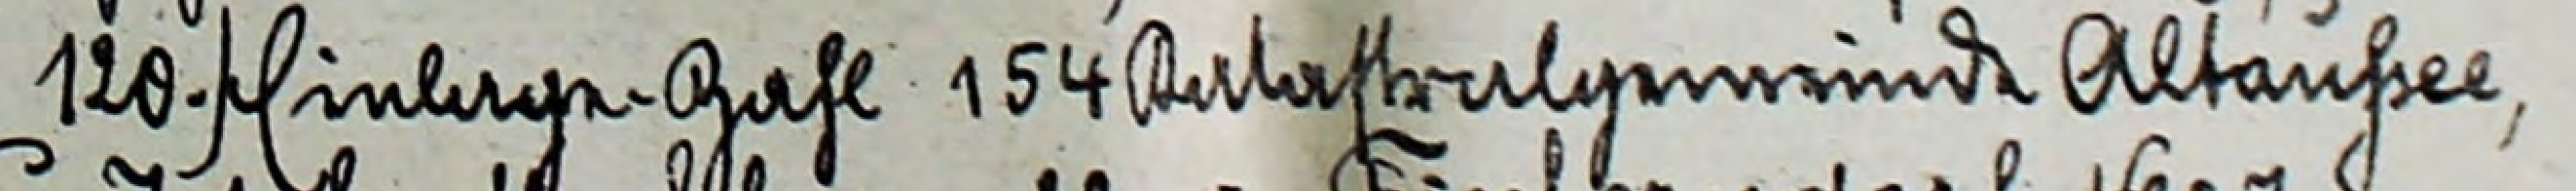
120.) Einlage - Zahl 154 Katastralgemeinde Altaussee,
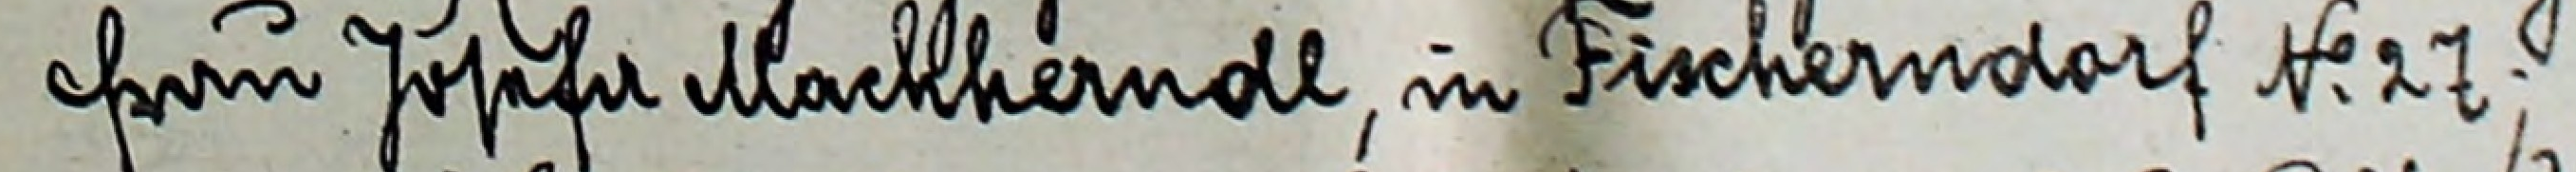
Frau Josefa Machherndl, in Fischerndorf № 27;
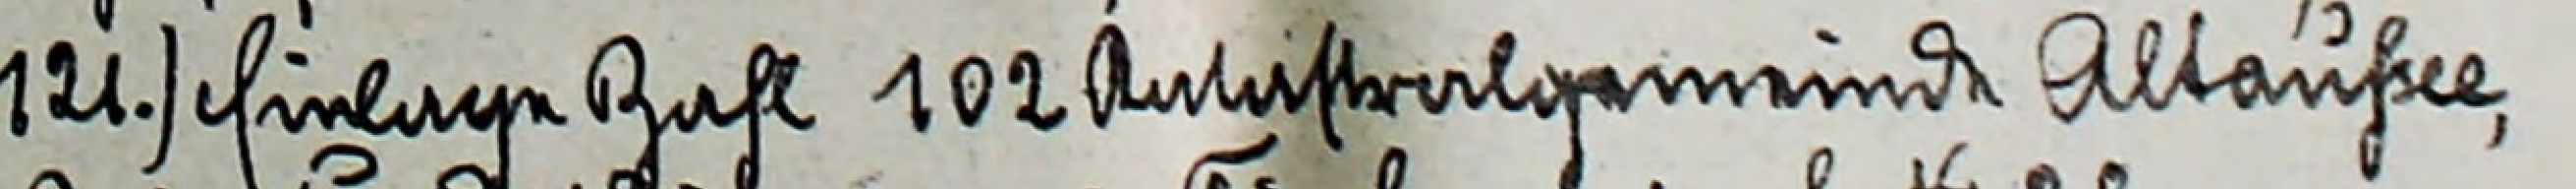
121.) Einlage Zahl 102 Katastralgemeinde Altaussee,
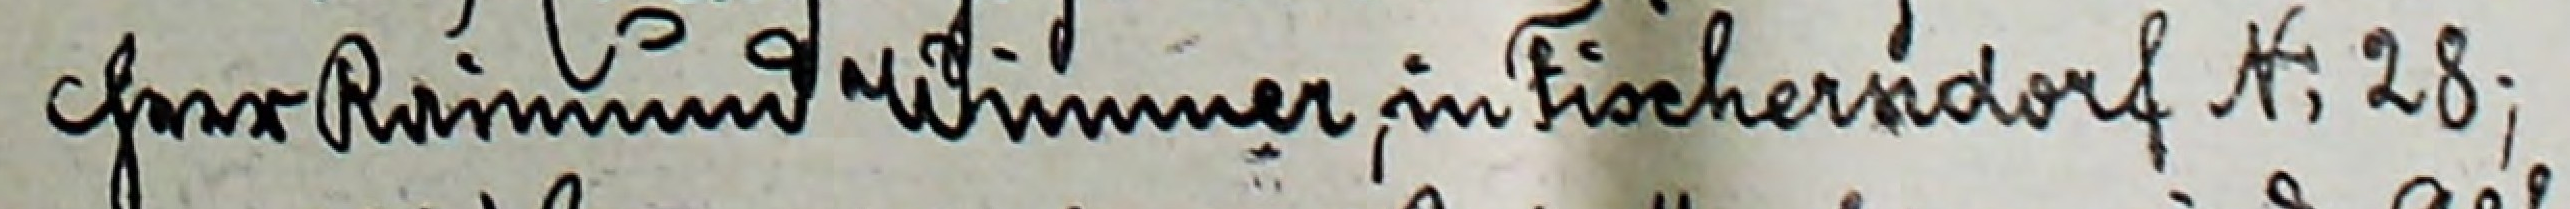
Herr Raimund Wimmer, in Fischerndorf № 28;
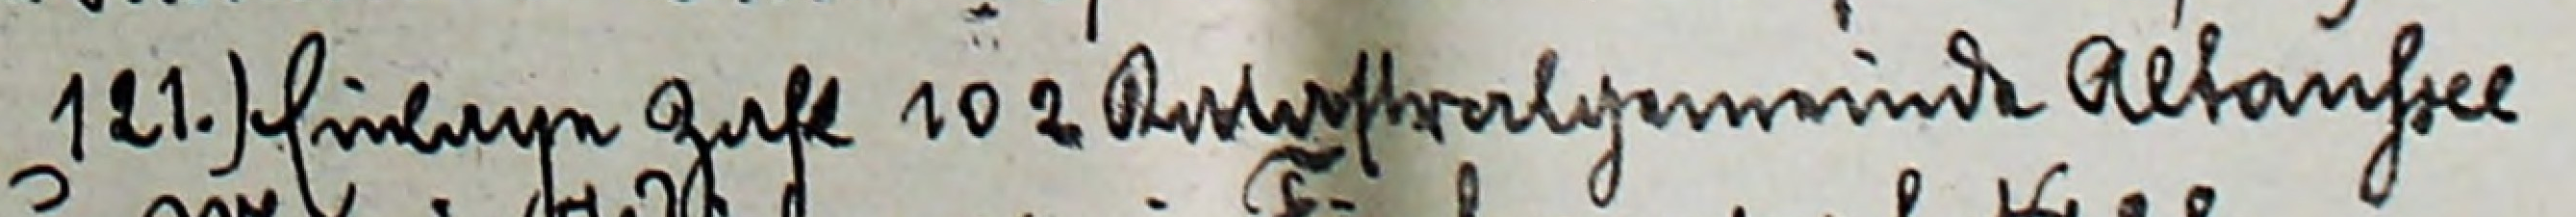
121.) Einlage Zahl 102 Katastralgemeinde Altaussee
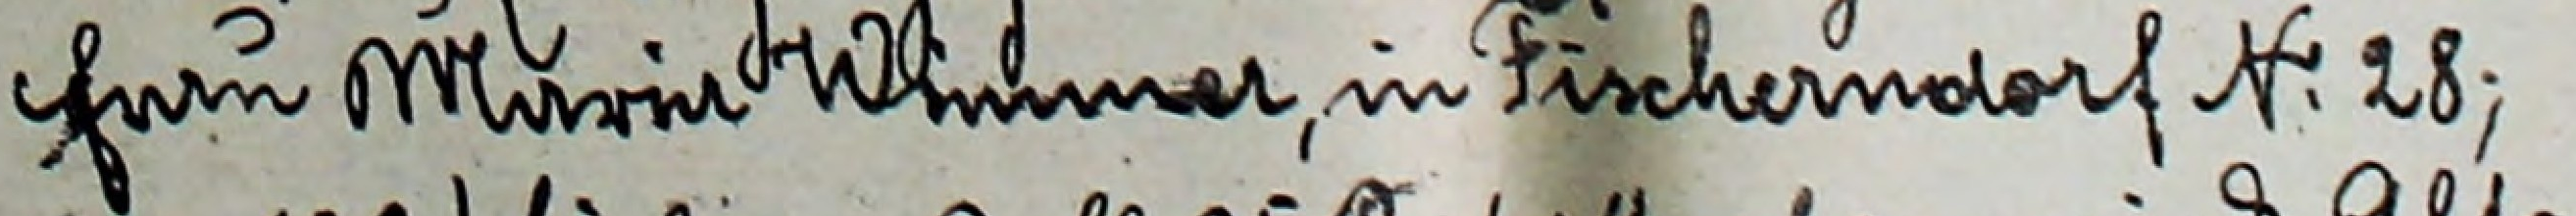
Frau Maria Wimmer, in Fischerndorf № 28;
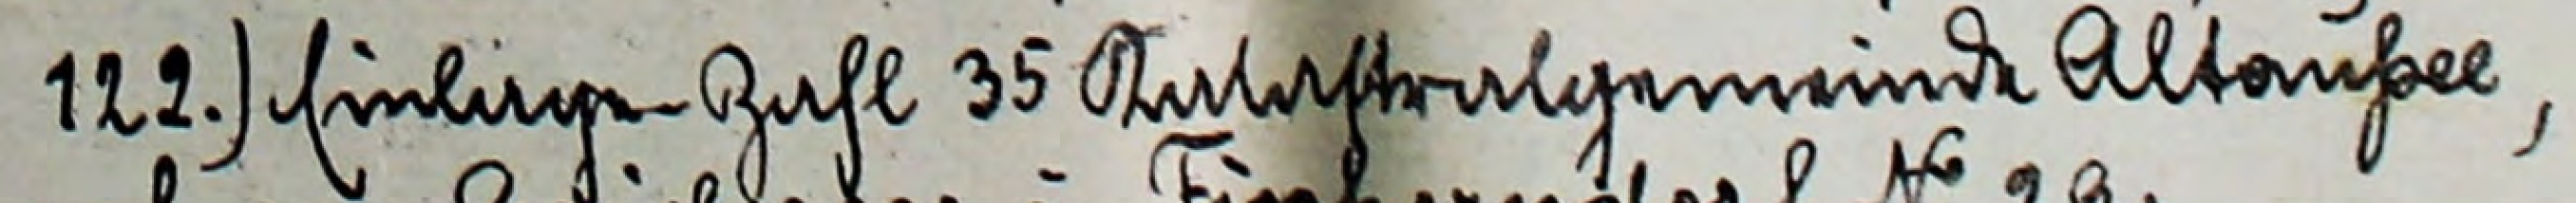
122.) Einlage - Zahl 35 Katastralgemeinde Altaussee,
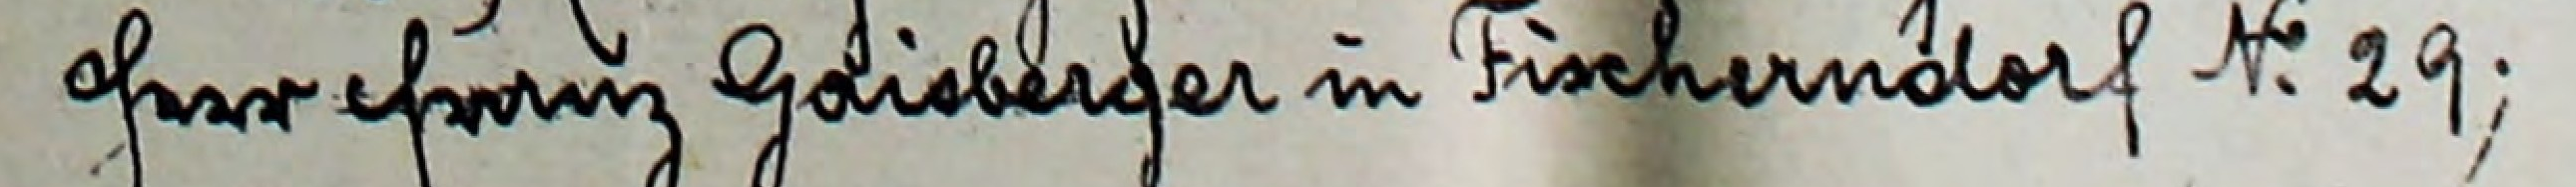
Herr Franz Gaisberger in Fischerndorf № 29;
